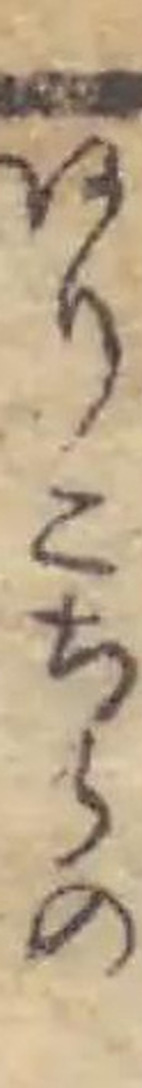ありこちらの
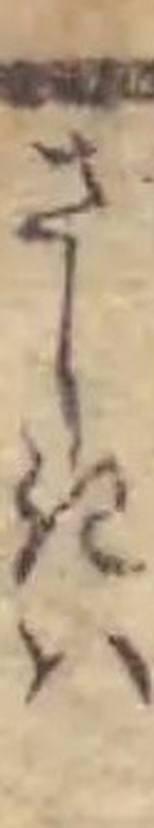さしきハ
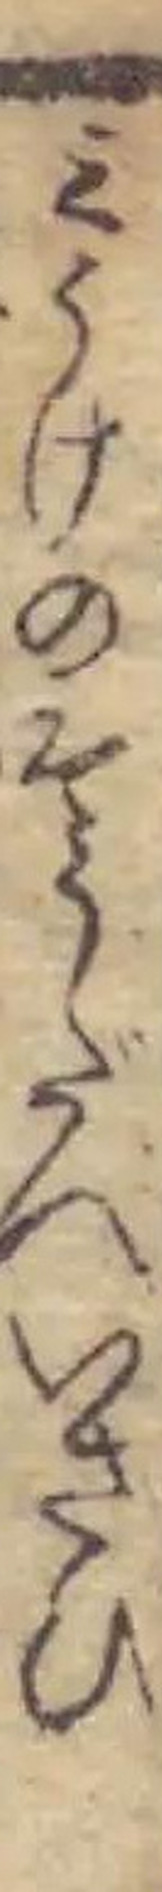ミうけのそうだんいさひ
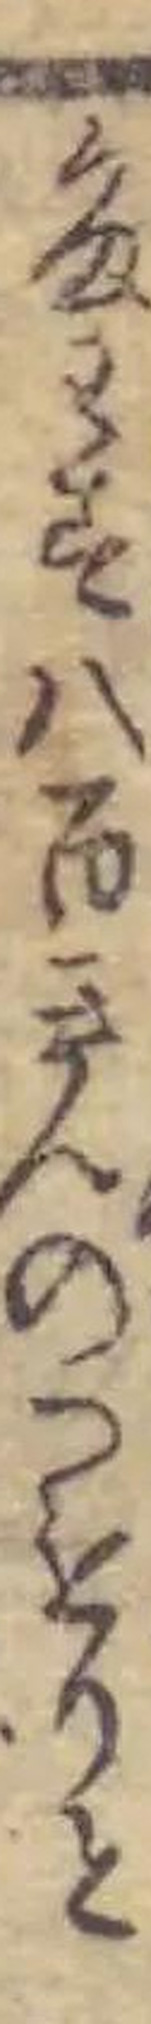かまわす八百きんのつもりと
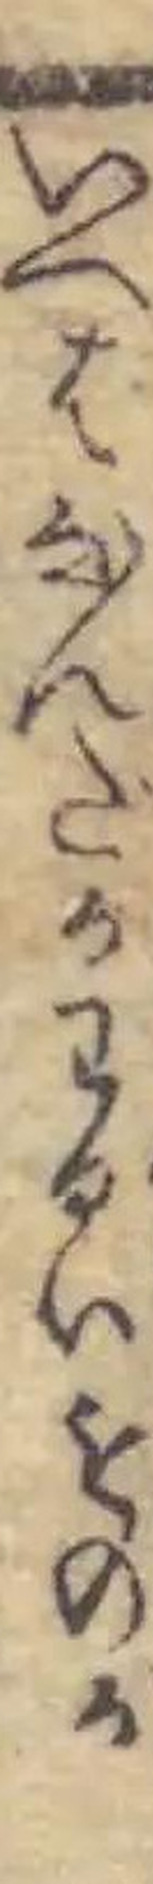いえへはなんだかわるいものか
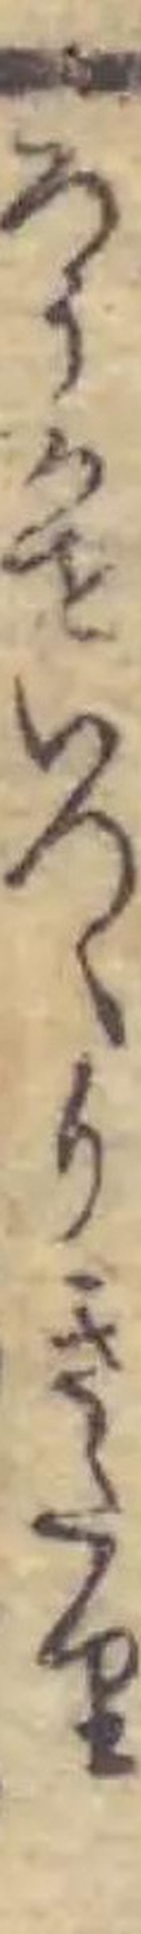ろうかをいつたりきたり
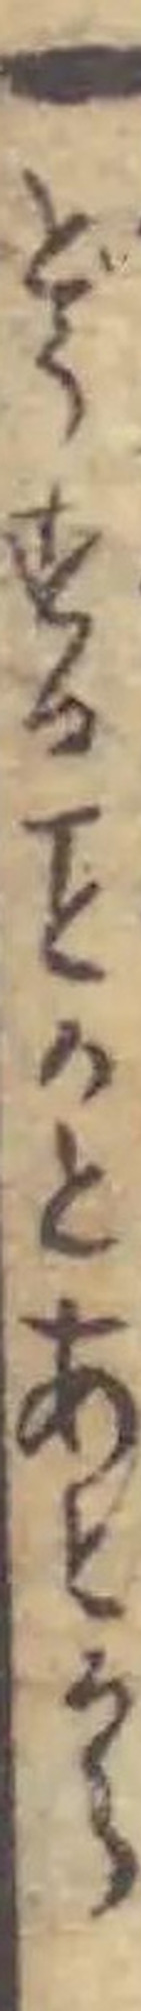どうすることかとあとから
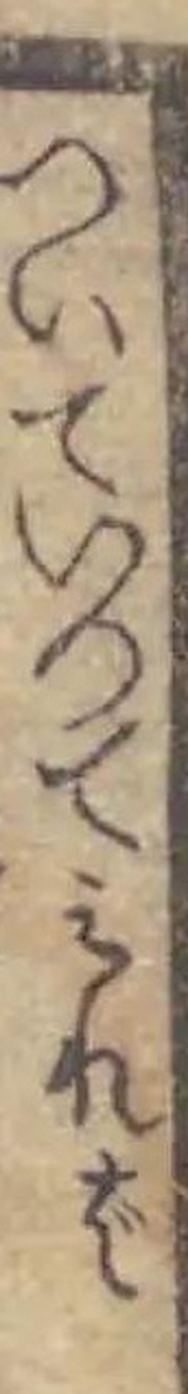ついていつてミれば
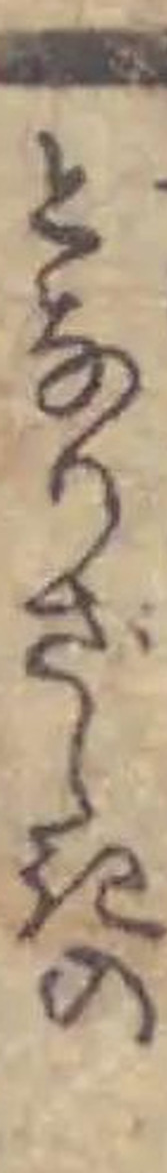となりざしきの
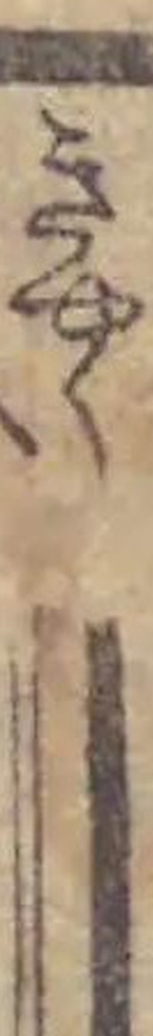きやく
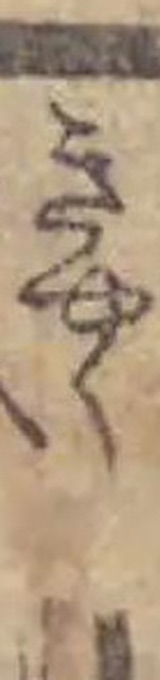きやく
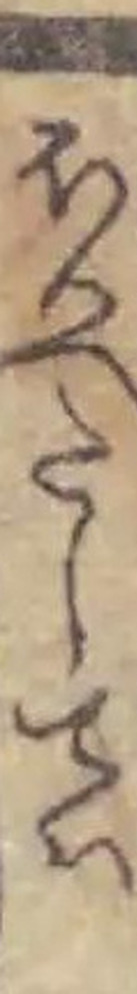ほかへたしてハ
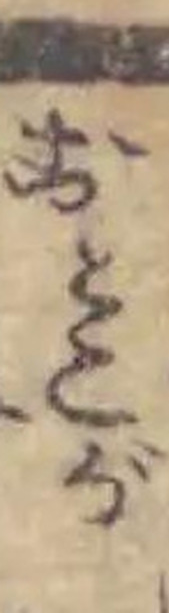おとこが
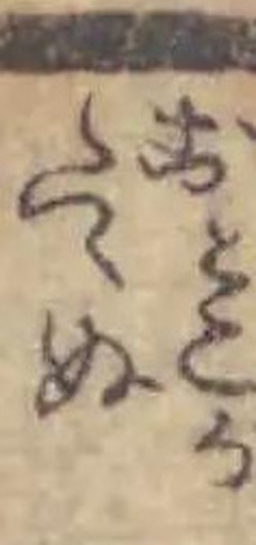たゝぬ
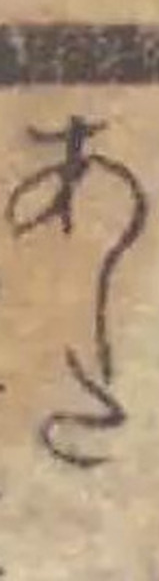あした
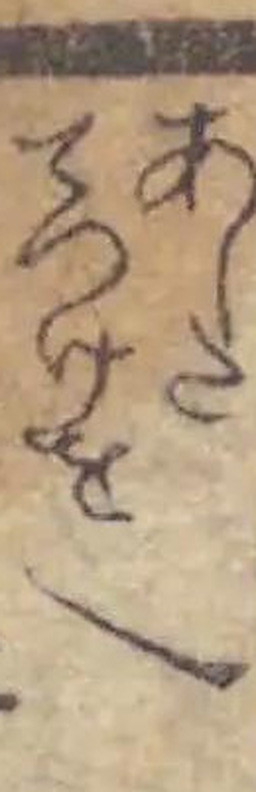てつけを
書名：豆男江戸見物 2巻
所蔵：国立国会図書館 National Diet Library, JAPAN
